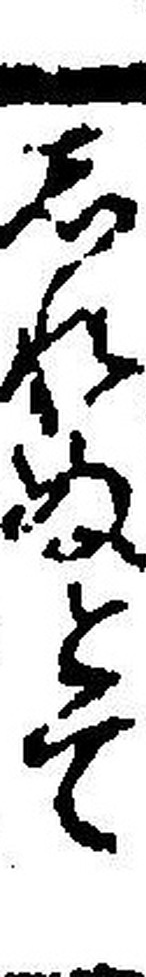しれぬとて
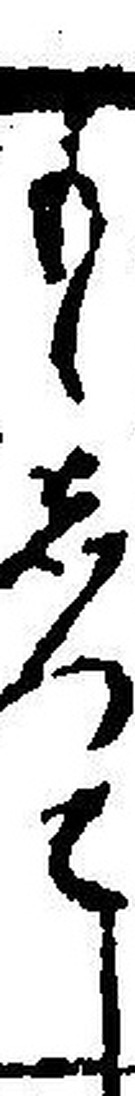もししつて
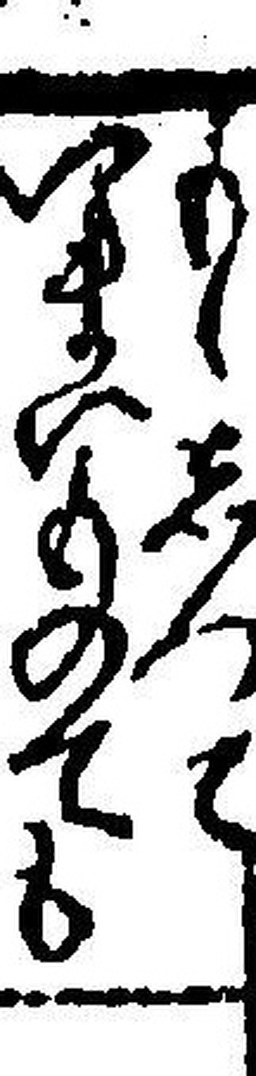いまいものても
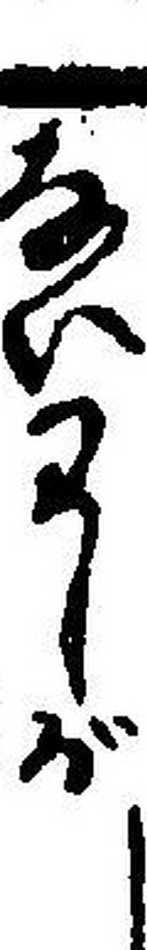ないわしが
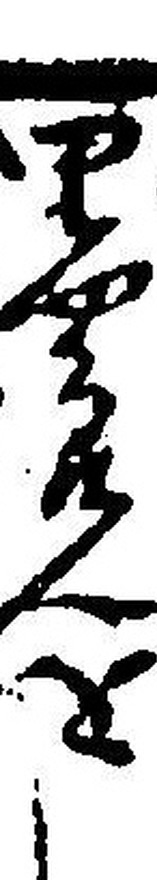りやうけんを
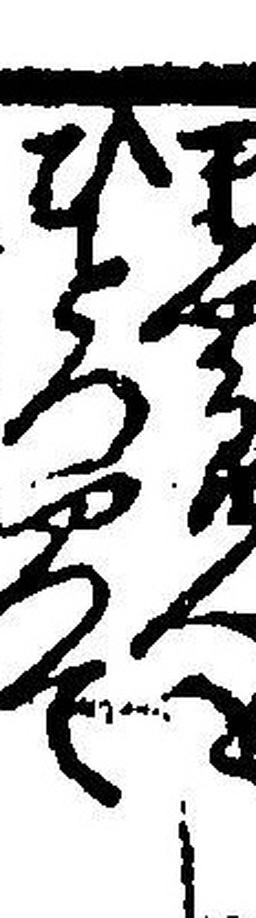ひとつやつて
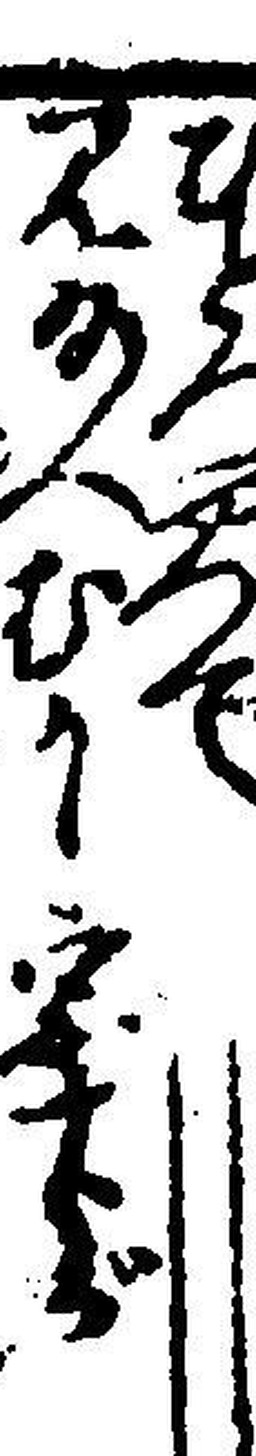みなへむかし宗十郎が
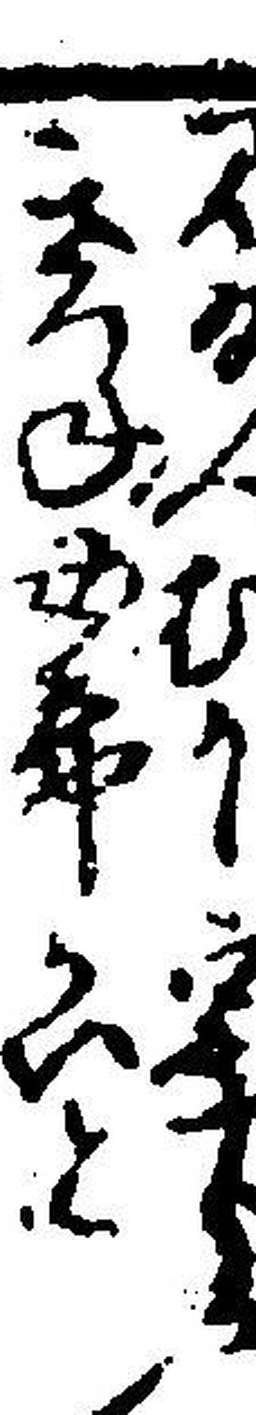きつね女郎かいと
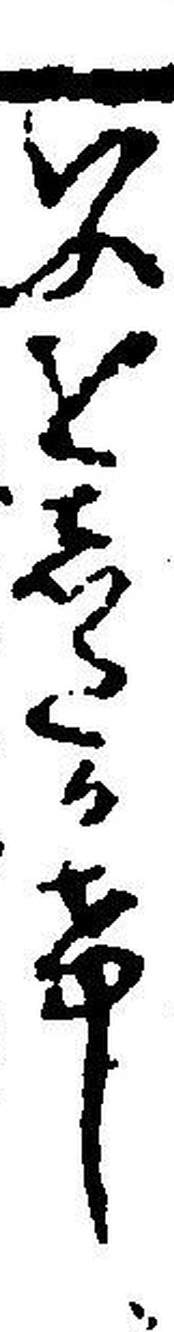いふをしたかけし
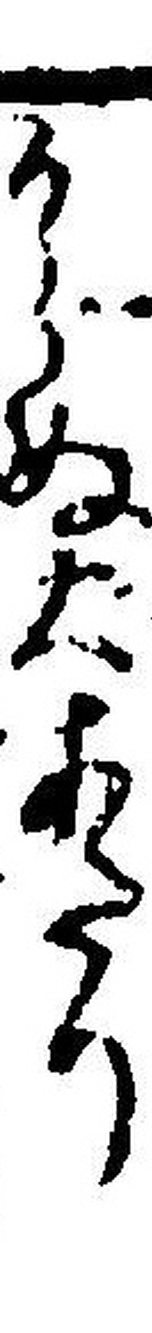からぬ大あたり
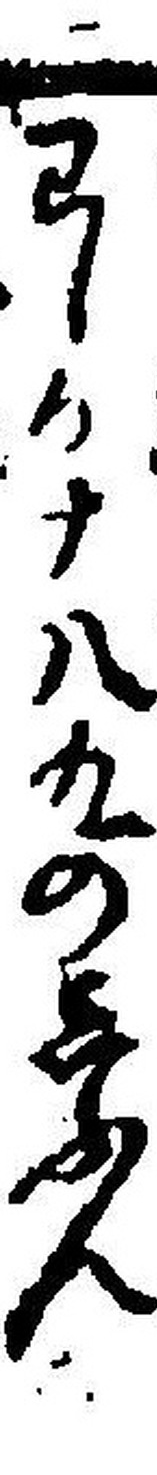わしか十八九のしふん
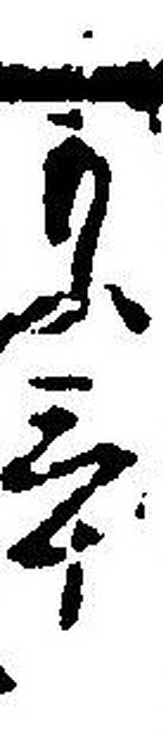もふ三十
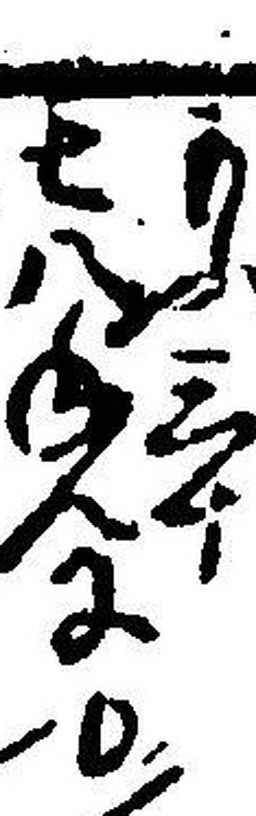七八ねんに
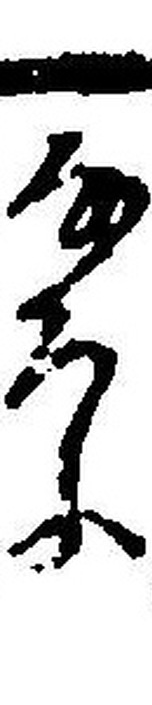なろふ
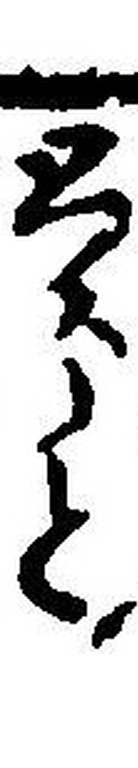とらと
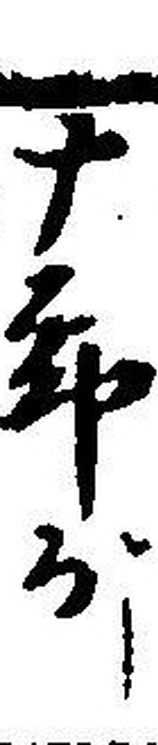十郎が
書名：間違狐之女郎買 / 市場通笑作
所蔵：東京大学総合図書館 General Library in the University of Tokyo, JAPAN
